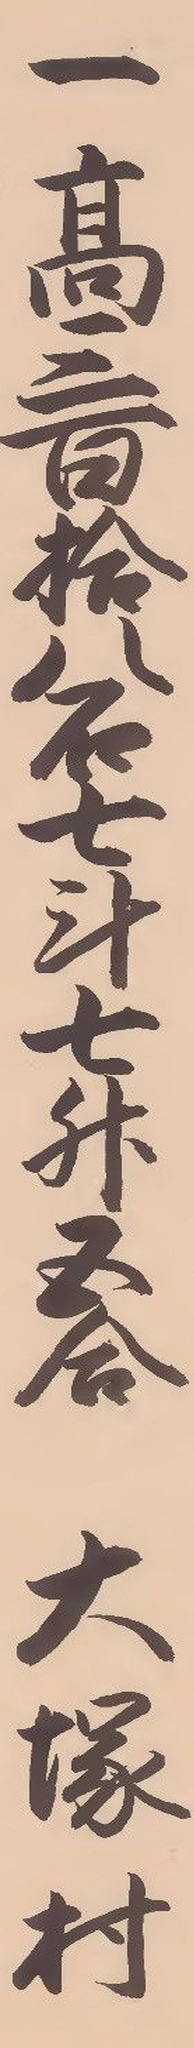一高三百拾八石七斗七升五合大塚村
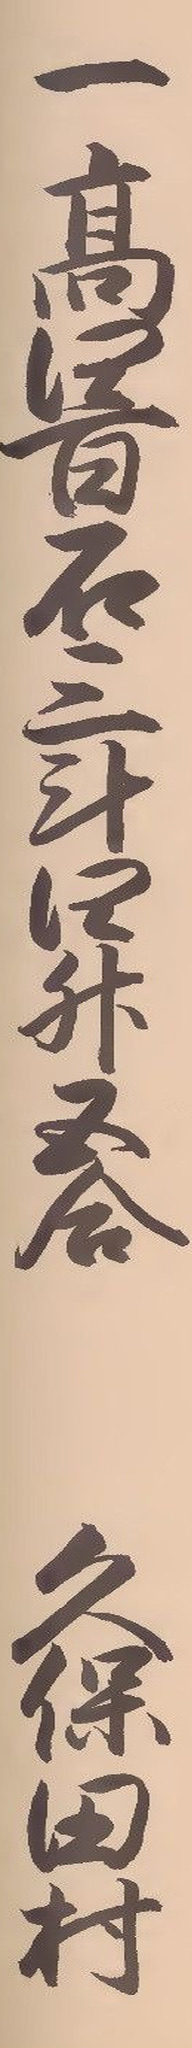一高四百石三斗四升五合久保田村
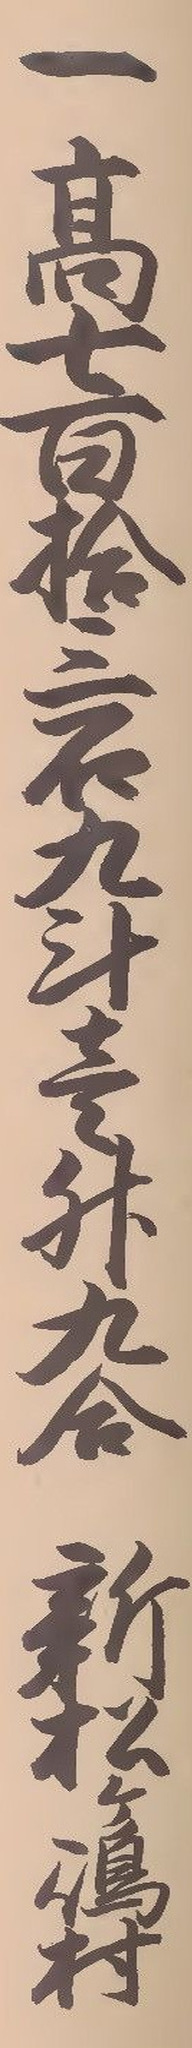一高七百拾三石九斗壱升九合新松ケ嶋村
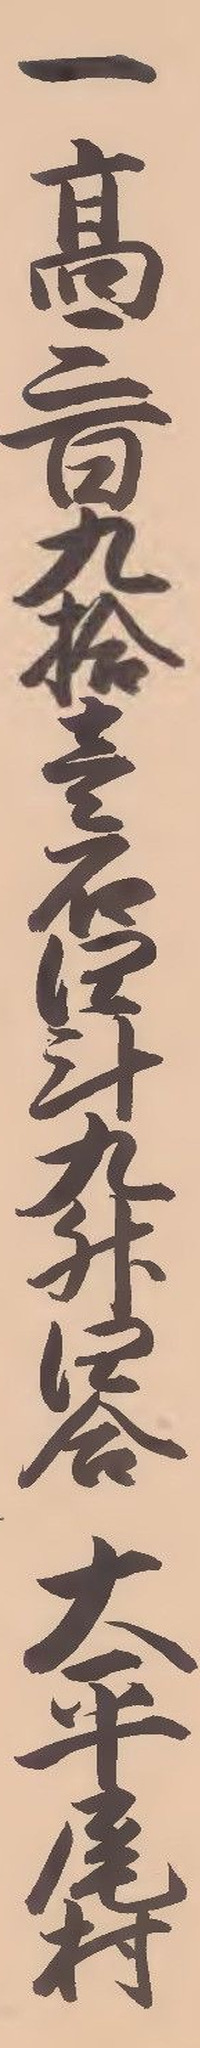一高三百九拾壱石四斗九升四合大平尾村
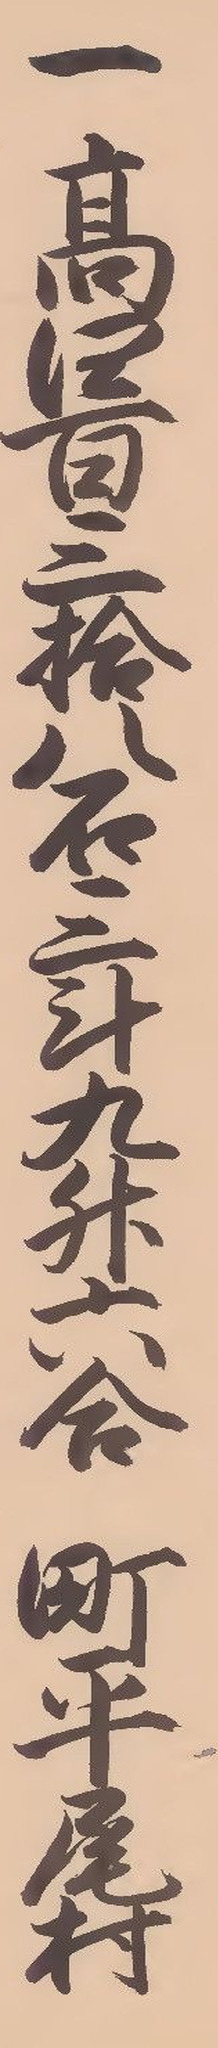一高四百三拾八石三斗九升六合町平尾村

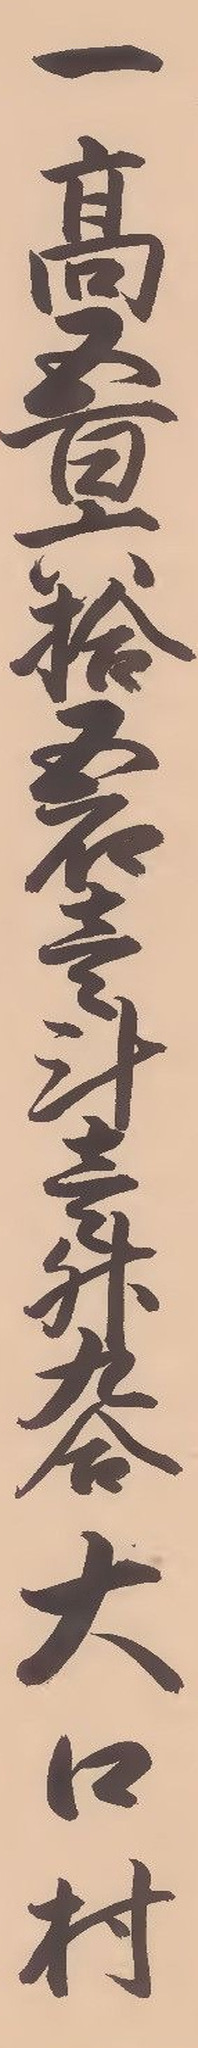一高五百六拾五石壱斗壱升九合大口村
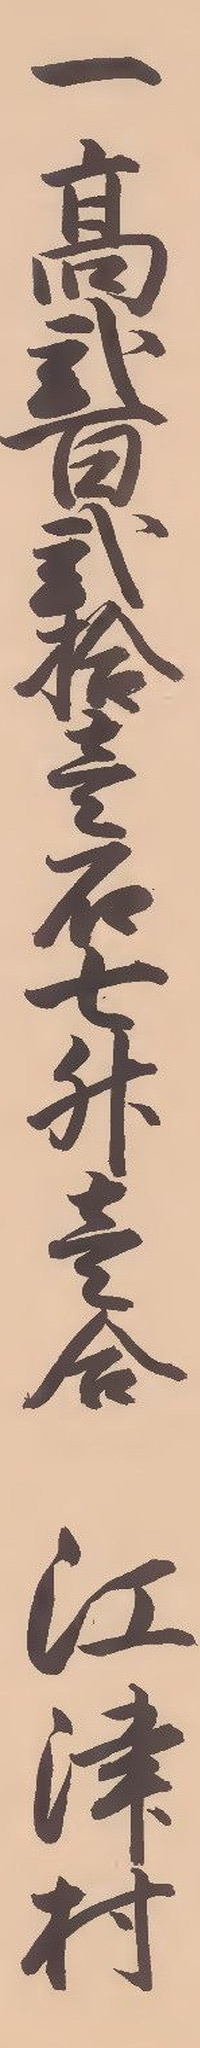一高弐百弐拾壱石七升壱合江津村
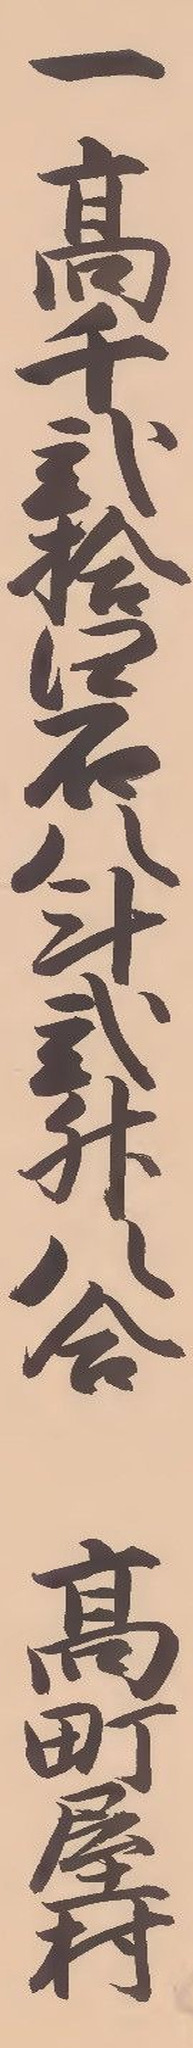一高千弐拾四石八斗弐升八合高町屋村
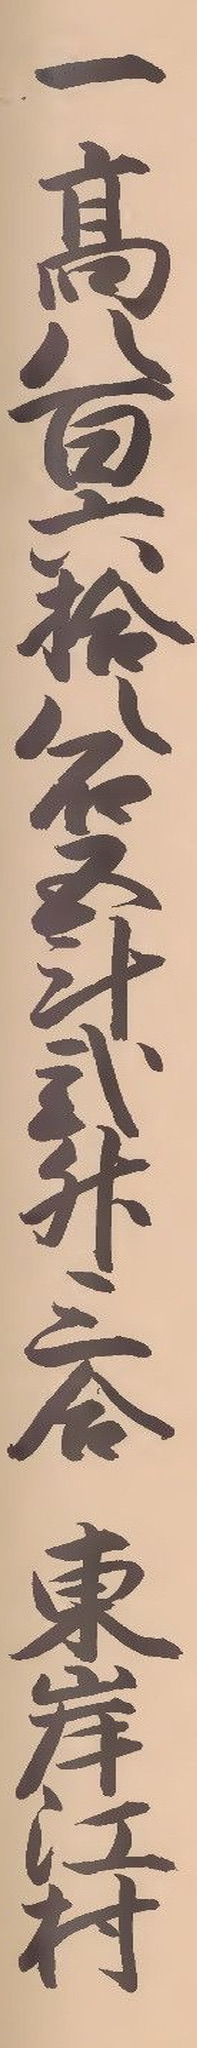一高八百六拾八石五斗弐升三合東岸江村
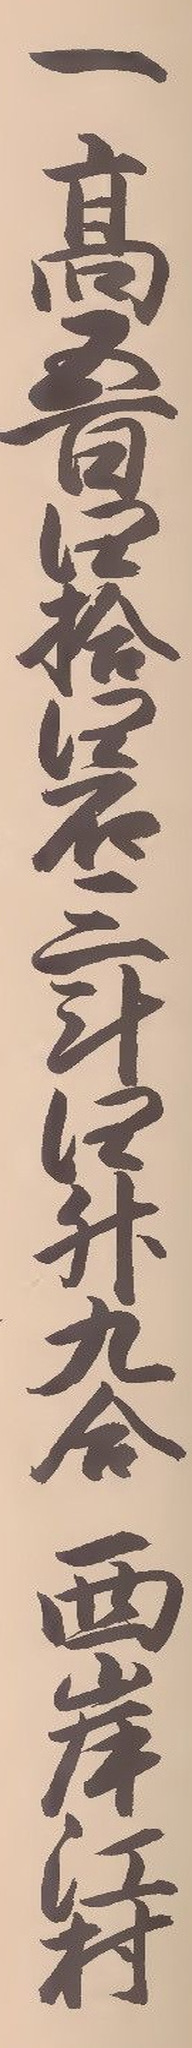一高五百四拾四石三斗四升九合西岸江村
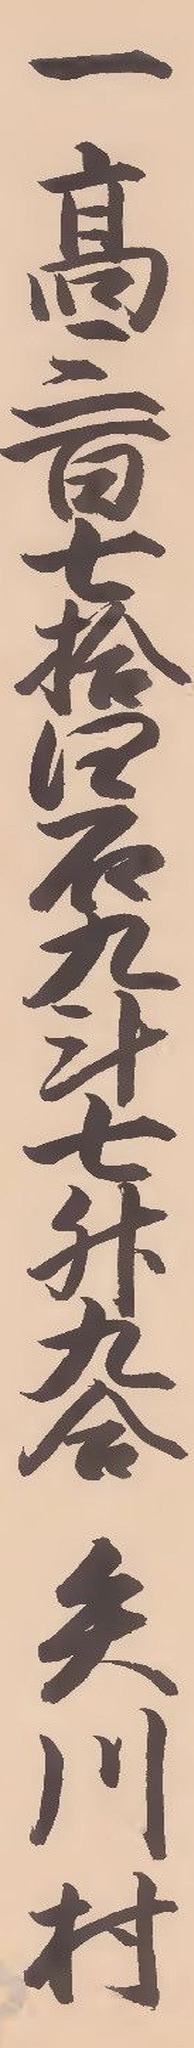一高三百七拾四石九斗七升九合矢川村
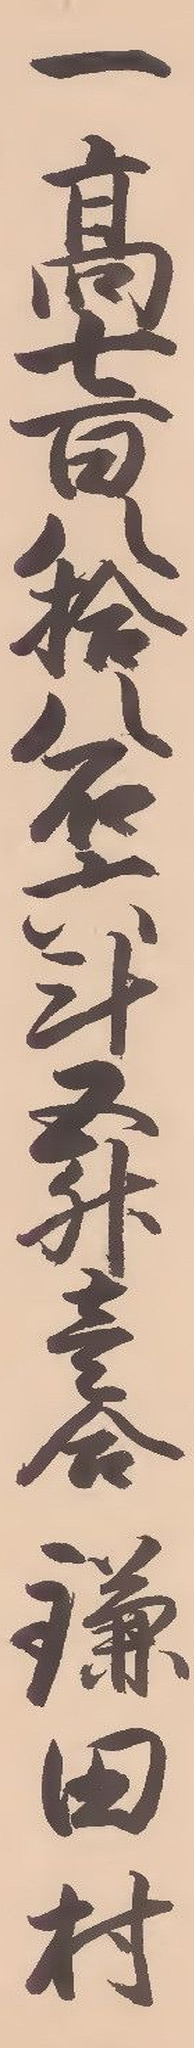一高七百八拾八石六斗五升壱合鎌田村
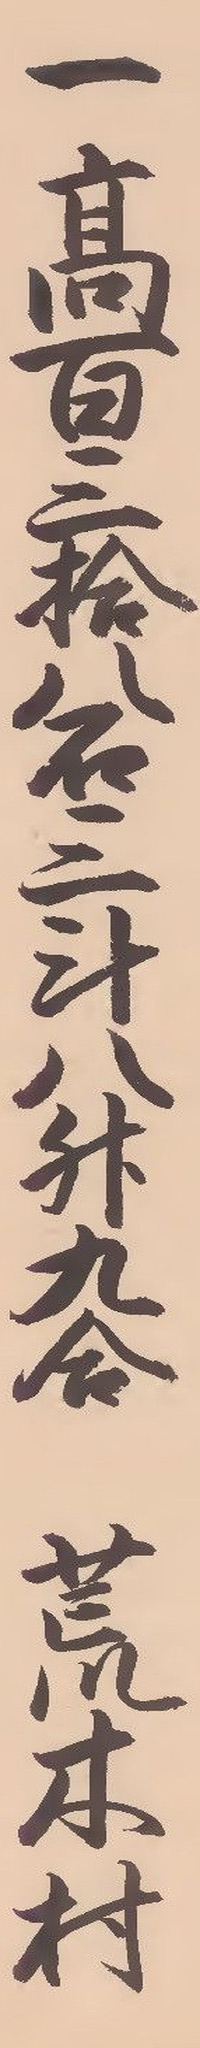一高百三拾八石三斗八升九合荒木村

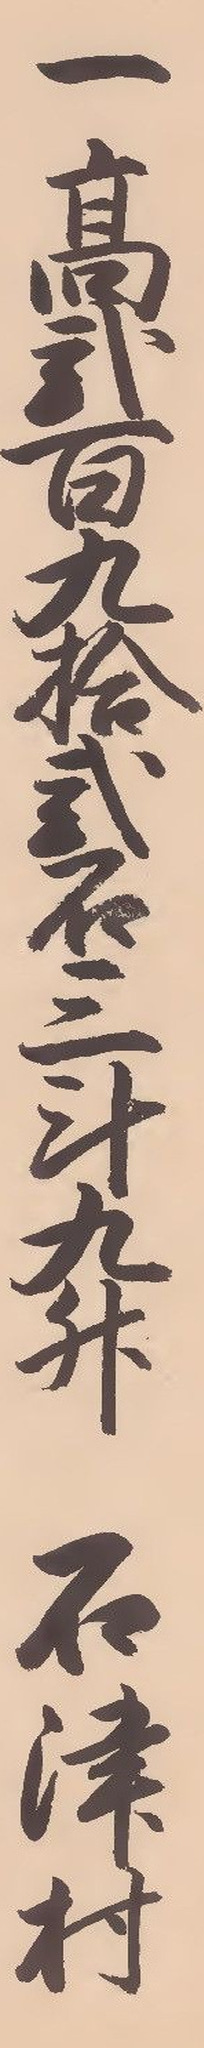一高弐百九拾弐石三斗九升石津村
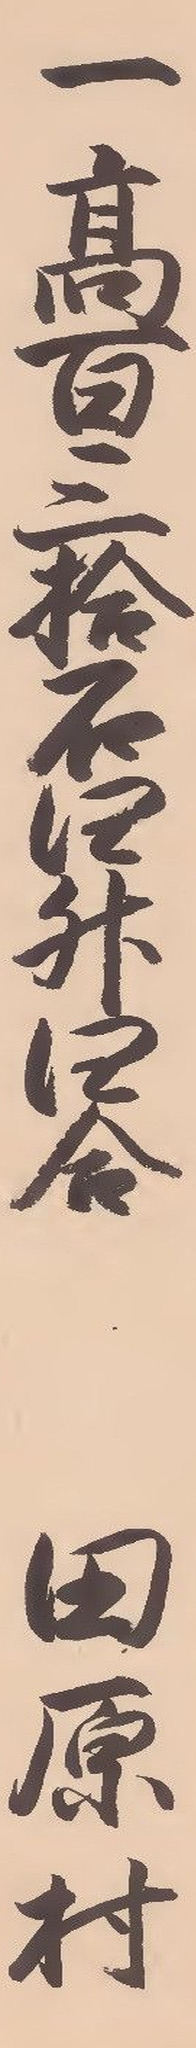一高百三拾石四升四合田原村
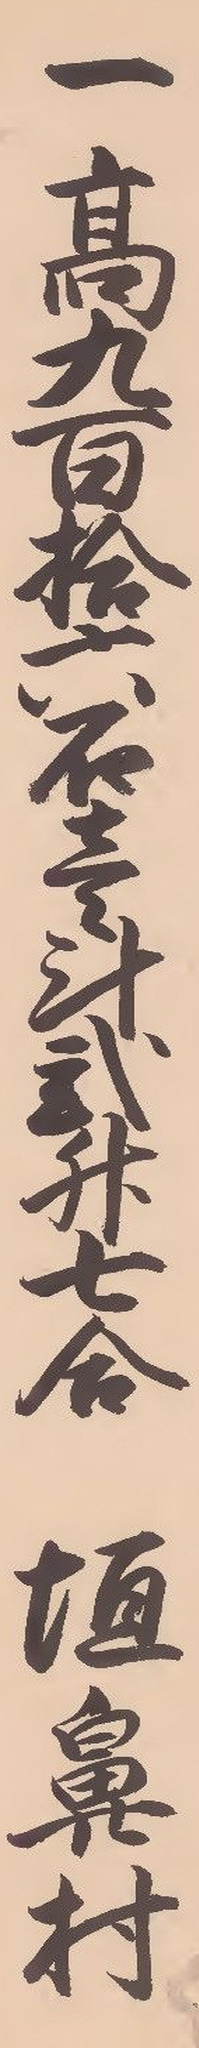一高九百拾六石壱斗弐升七合垣鼻村
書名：伊勢国郷帳
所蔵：国立公文書館 National Archives of Japan
